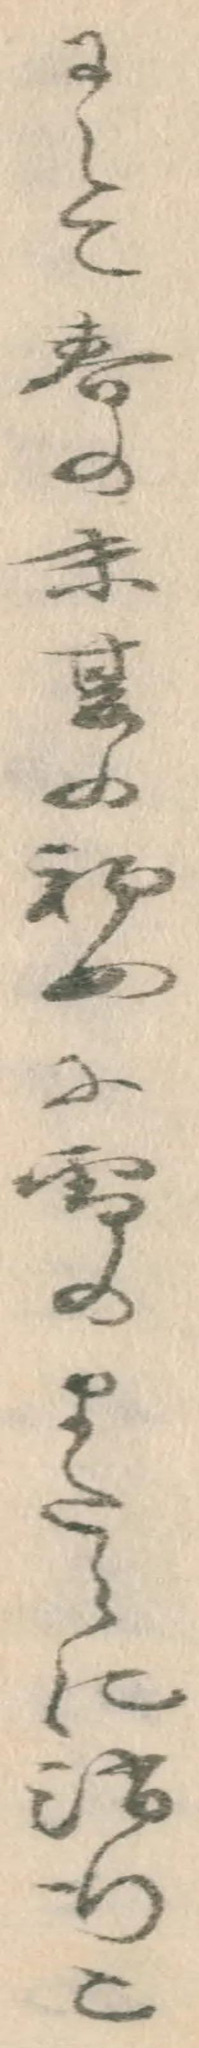にして春の末夏の初めに雪またらに消行こ
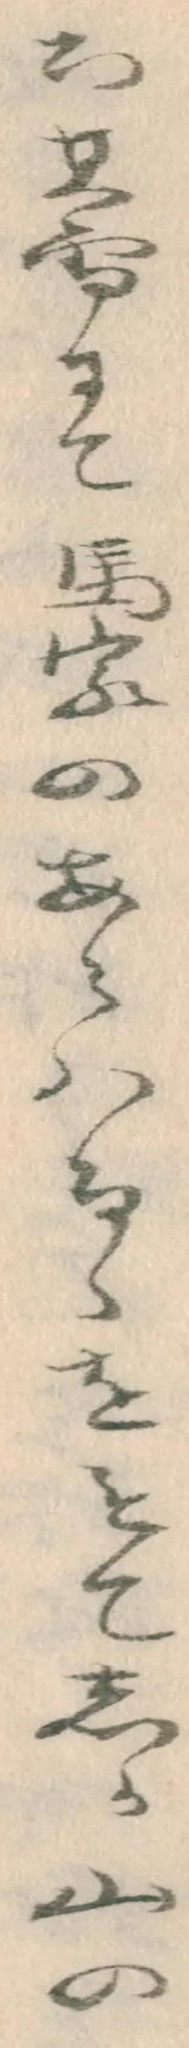ろ其雪にて馬家のあらはるゝをとてしか山の
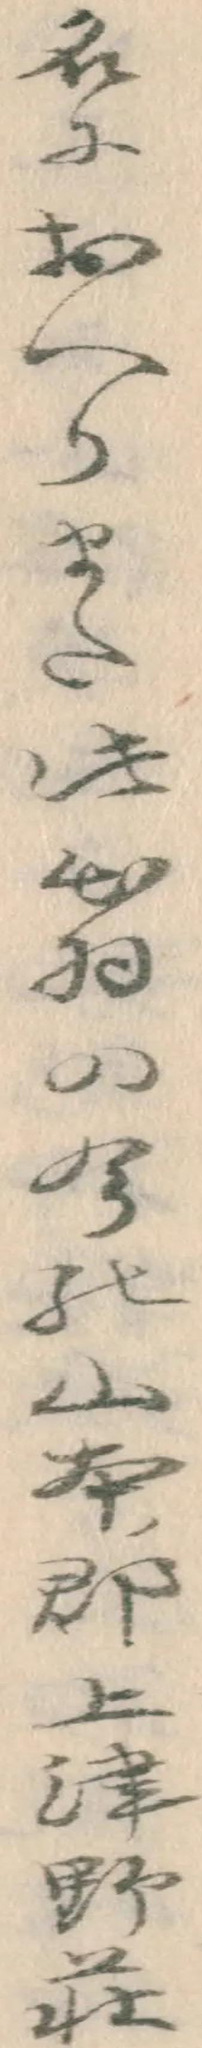名におへりまた此出羽の今の山本郡上津野荘
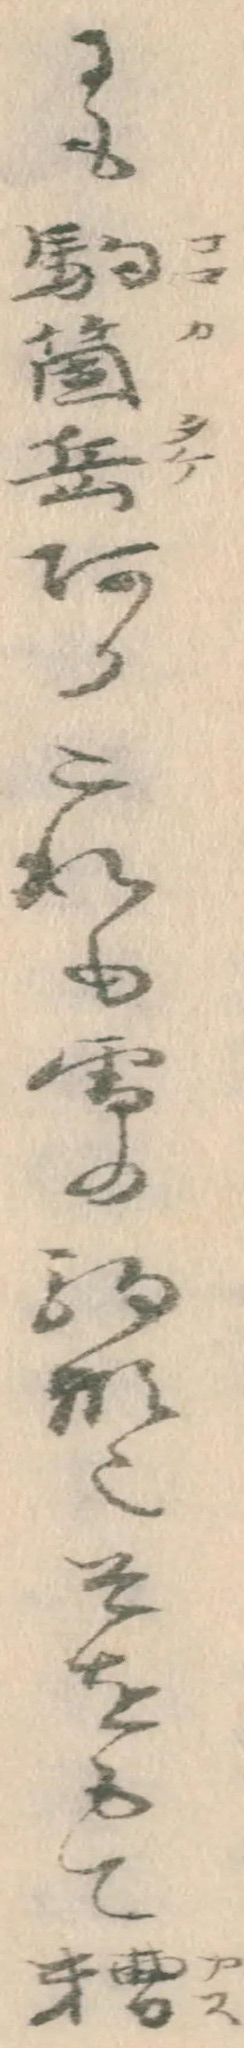にも駒箇岳ありこれも雪の駒形也そをもて糟
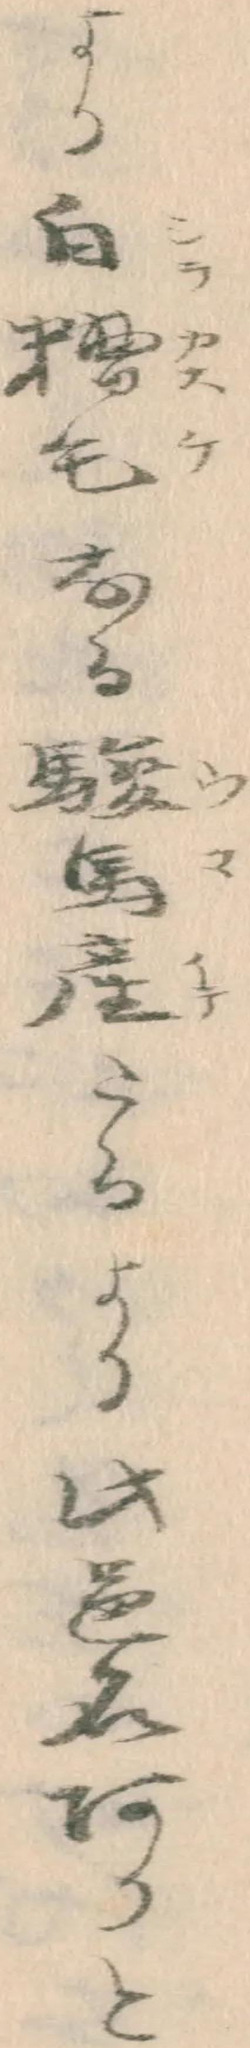より白糟毛なる駿馬産たるより此邑名ありと
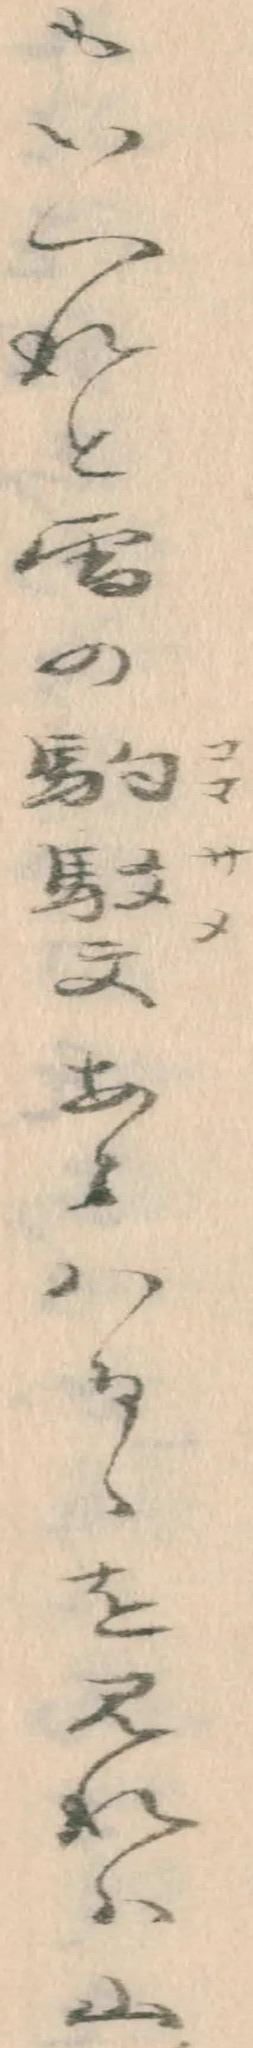もいへれと雪の駒駁文あらはるゝを見れは山
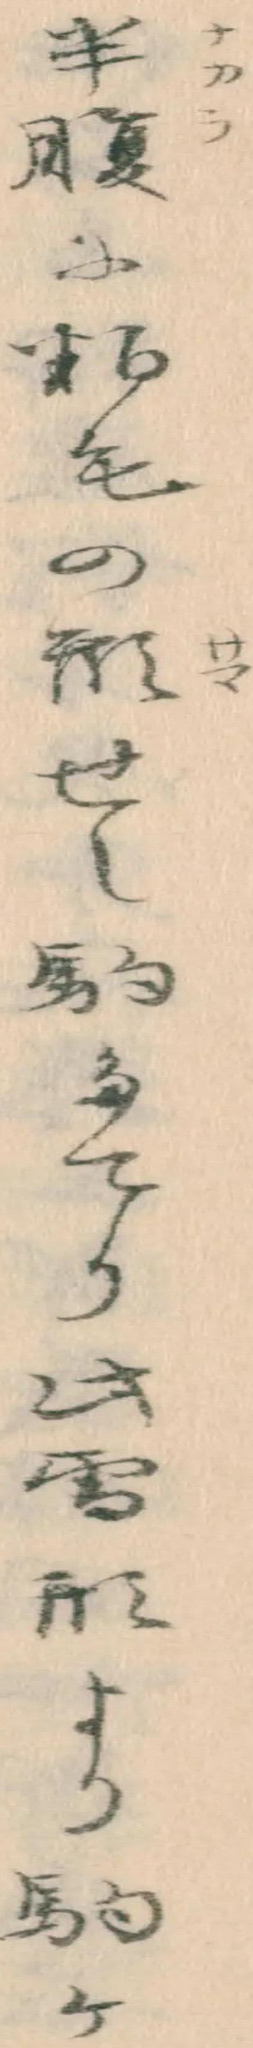半腹に粕毛の形せし駒たてり此雪形より駒ヶ
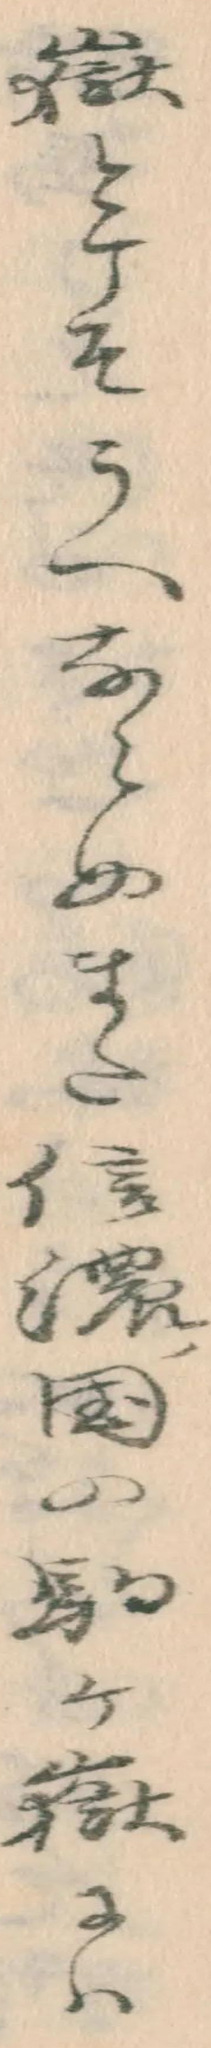嶽とこそうへならめまた信濃国の駒ヶ嶽には
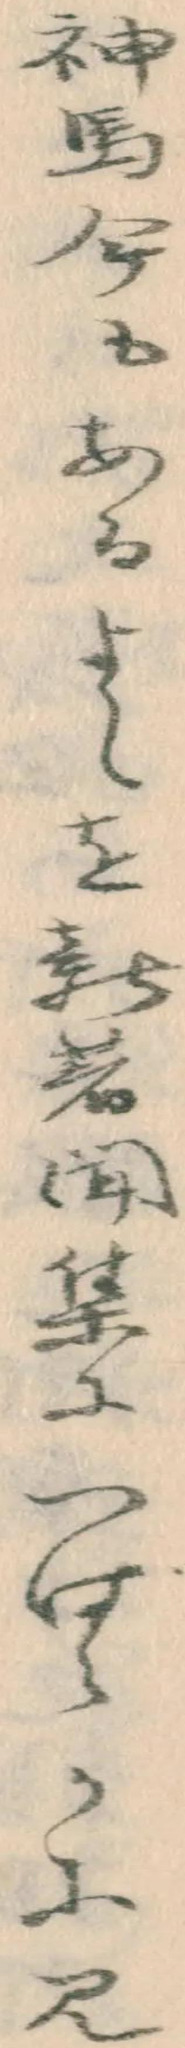神馬今もあるよしを新著聞集につばらかに見
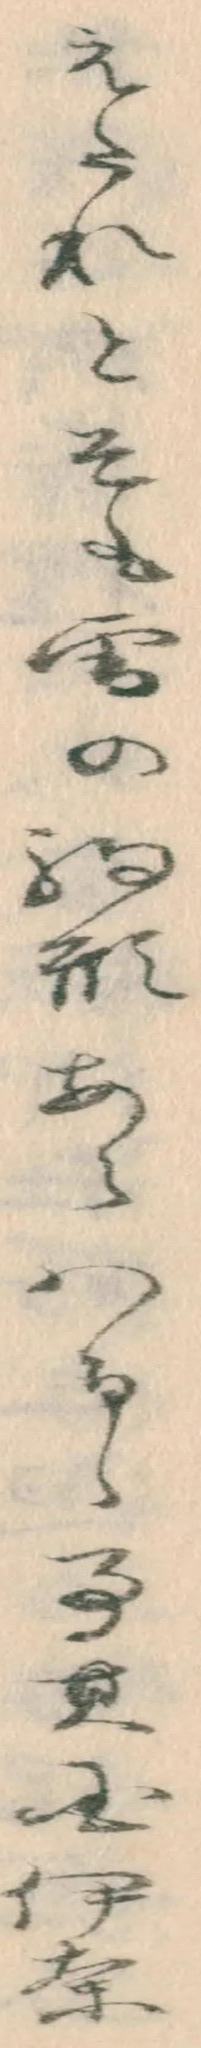えたれとそも雪の駒形あらはるゝ事其国伊奈
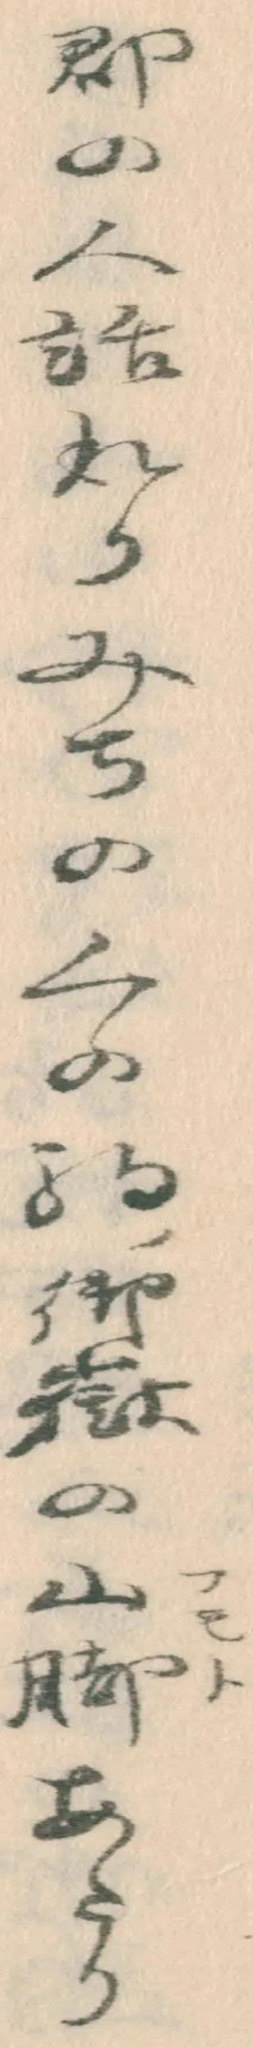郡の人話れりみちのくの駒御嶽の山脚あたり
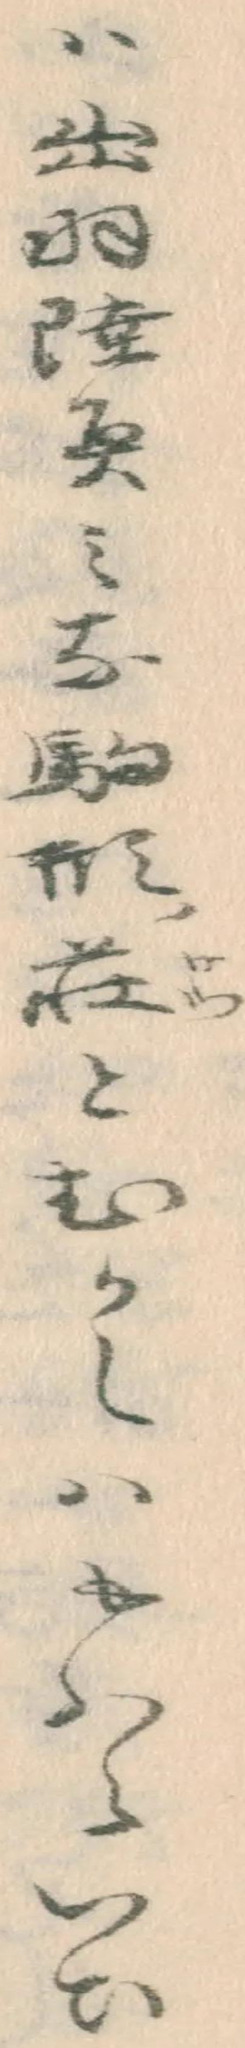は出羽陸奥みな駒形荘とむかしはもはらいひ
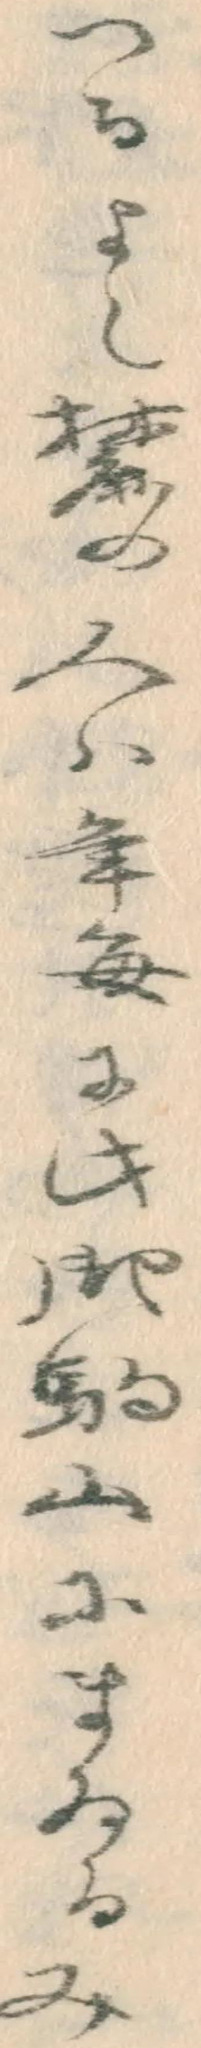つるよし麓の人は年毎に此御駒山にまゐるみ
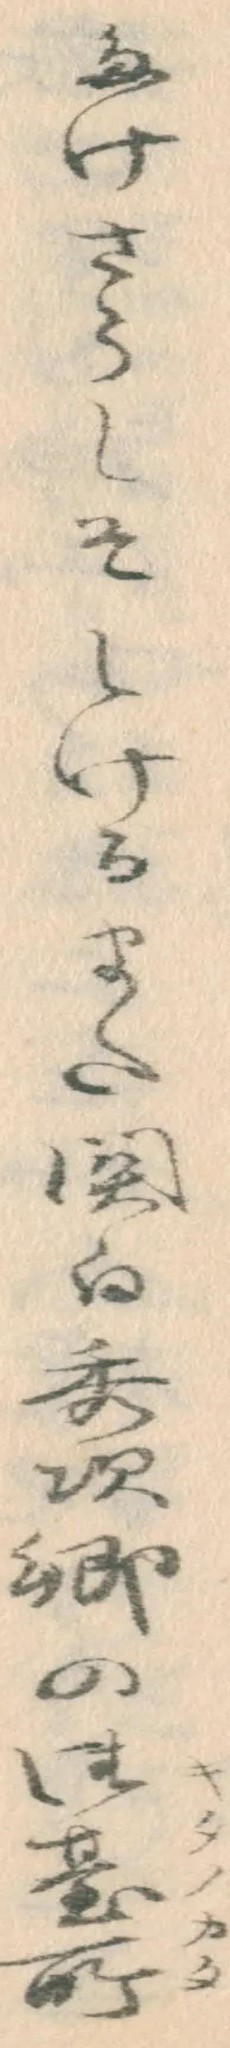たけさうしそしけるまた関白秀次卿の御䑓所
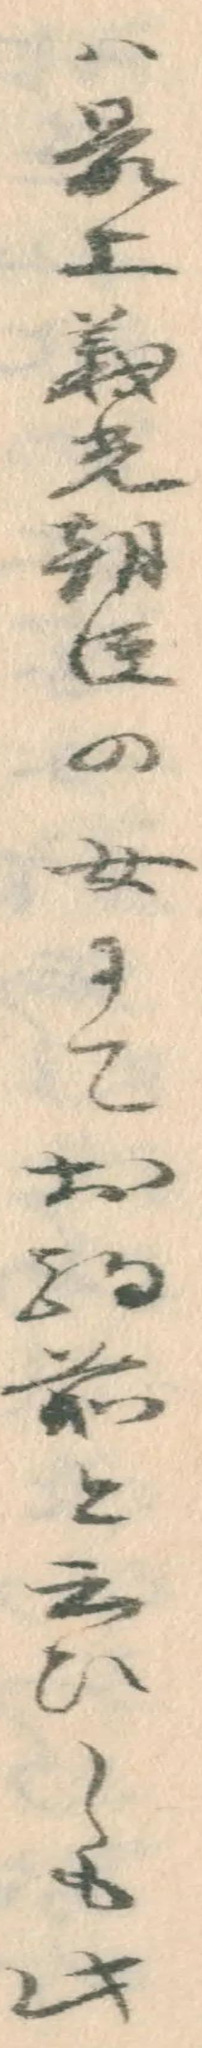は最上義光朝臣の女にてお駒前と云ひしも此
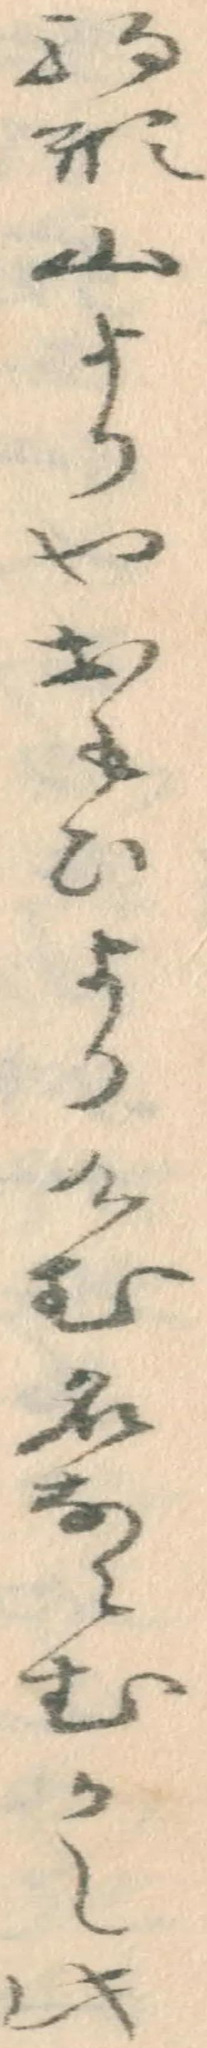駒形山よりやおもひよりけむ名ならむかかし此
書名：眞澄遊覽記[第2冊]
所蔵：国立国会図書館 National Diet Library, JAPAN
